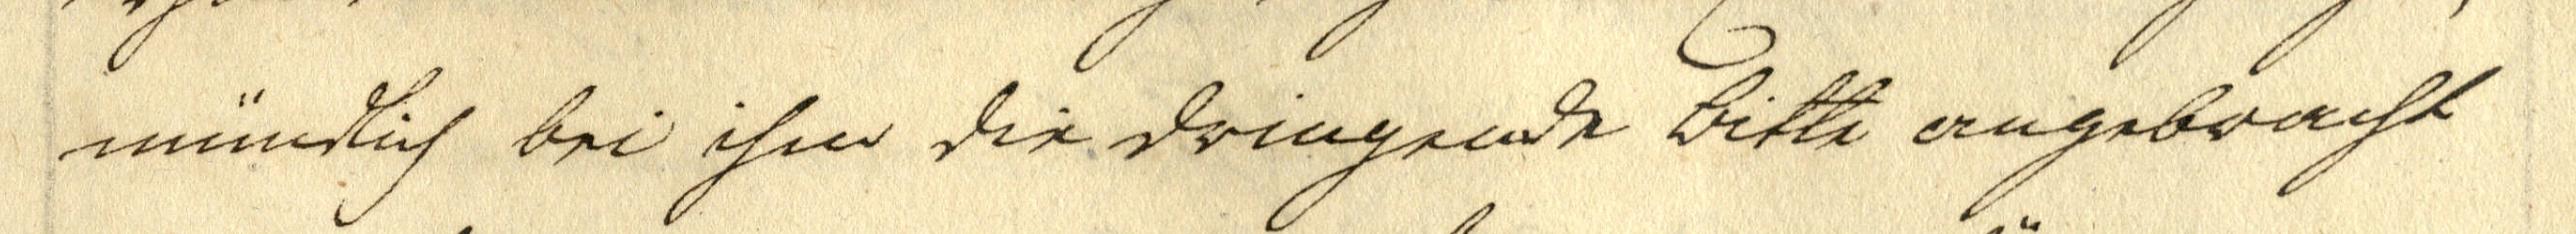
mündlich bei ihm die dringende Bitte angebracht
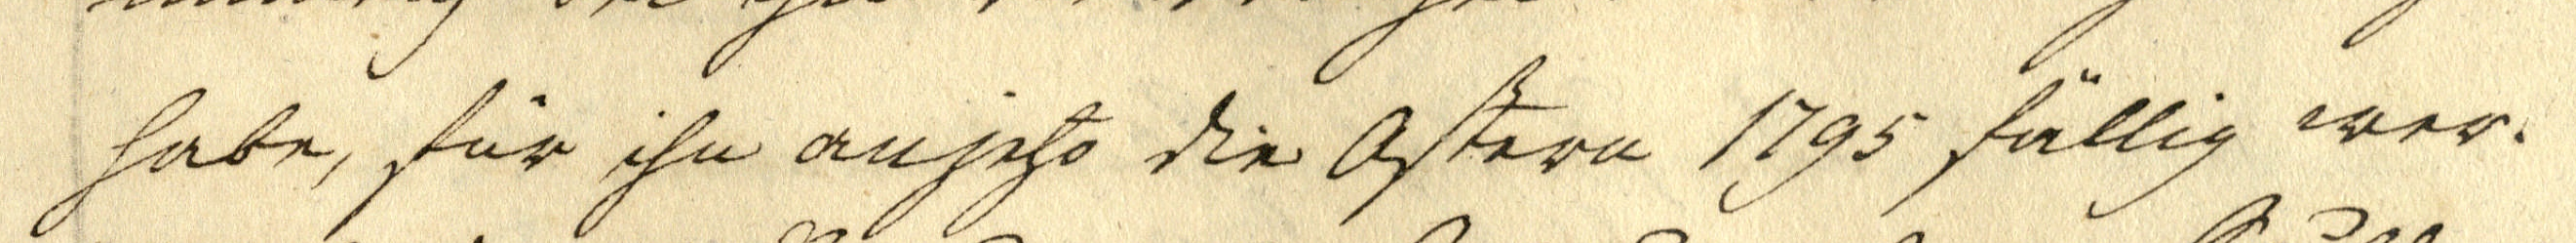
habe, für ihn anjetzo die Ostern 1795 fällig wer-
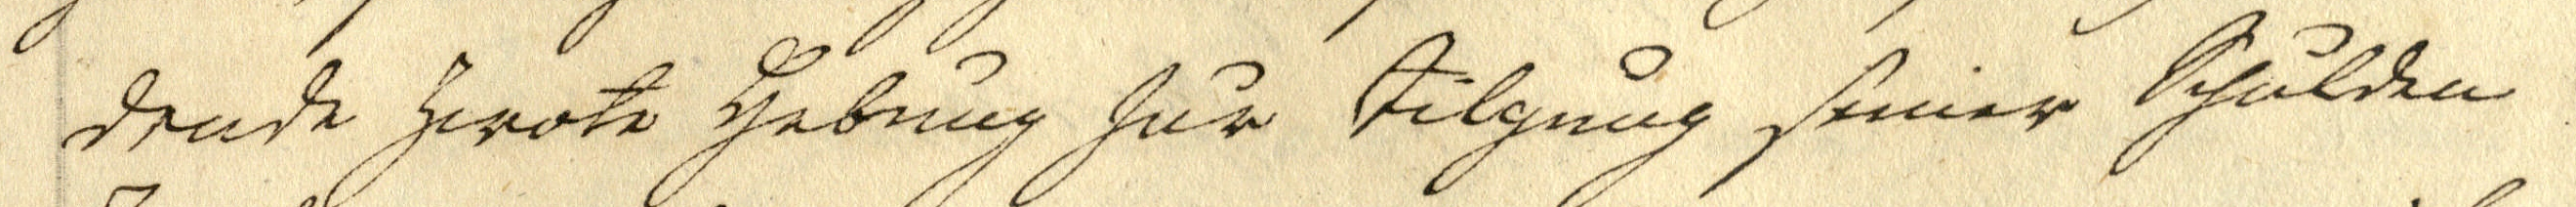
dende zwote Hebung zur Tilgung seiner Schulden
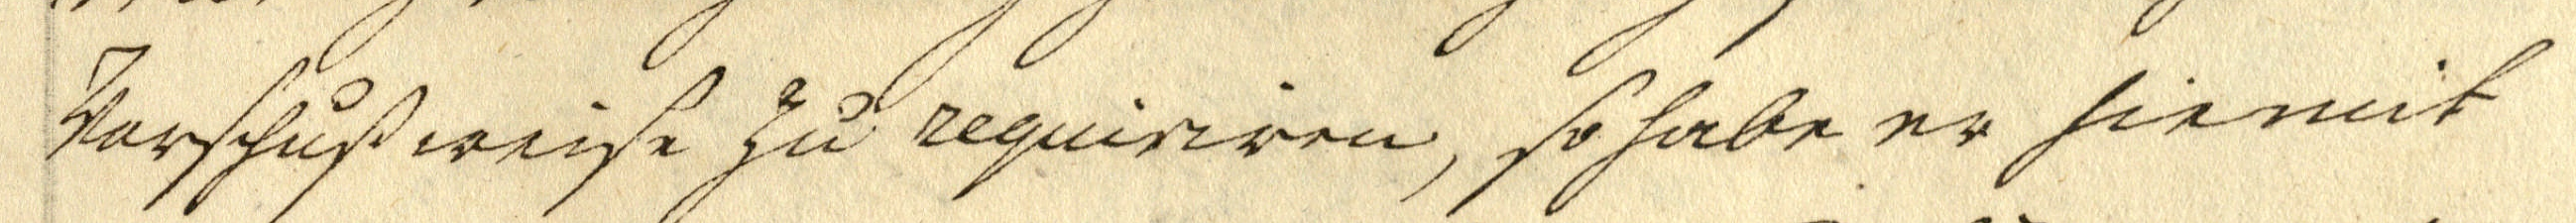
Vorschußweise zu requiriren, so habe er hiemit
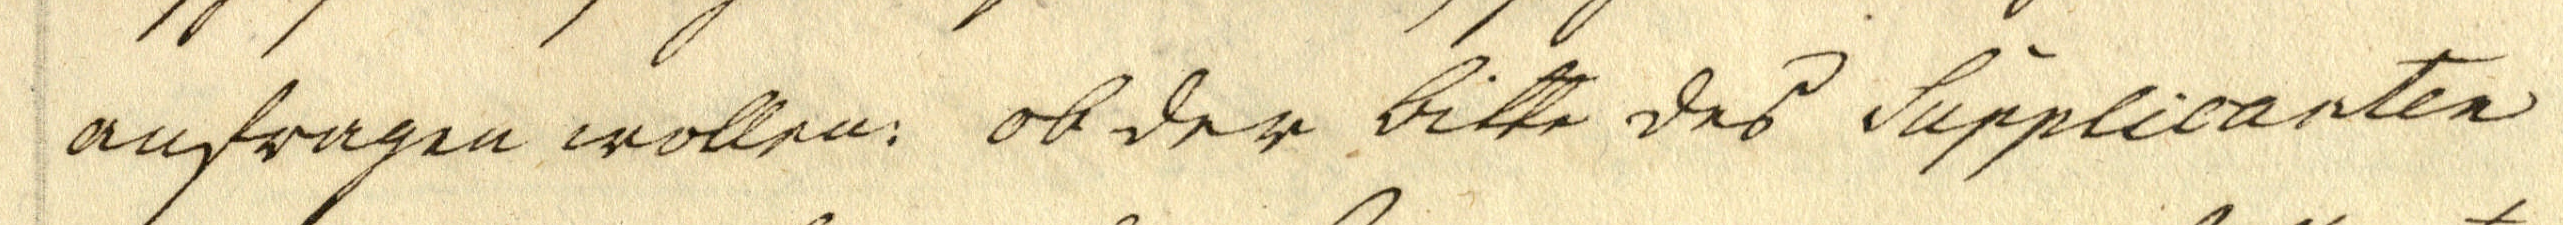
anfragen wollen: ob der Bitte des Supplicanten
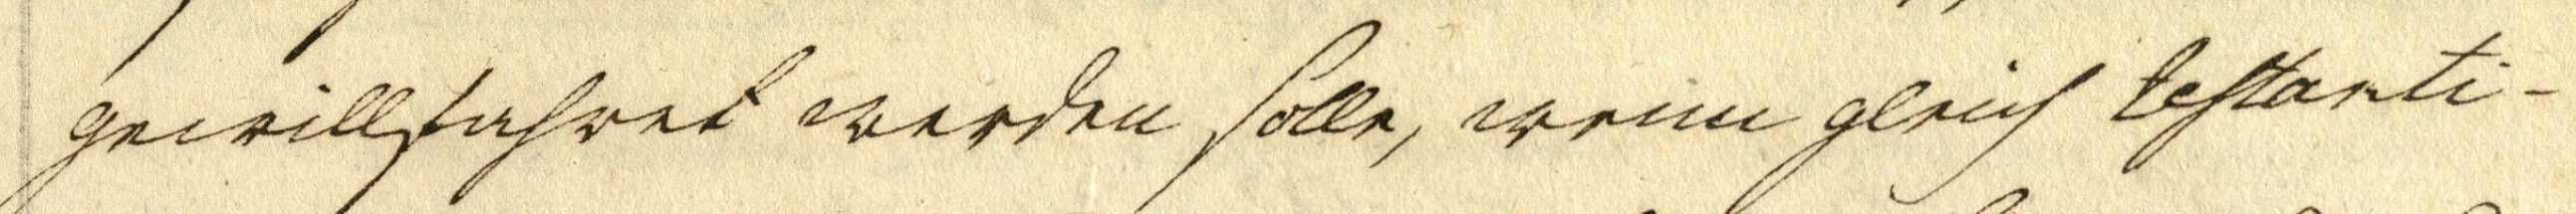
gewillfahret werden solle, wenn gleich testanti-
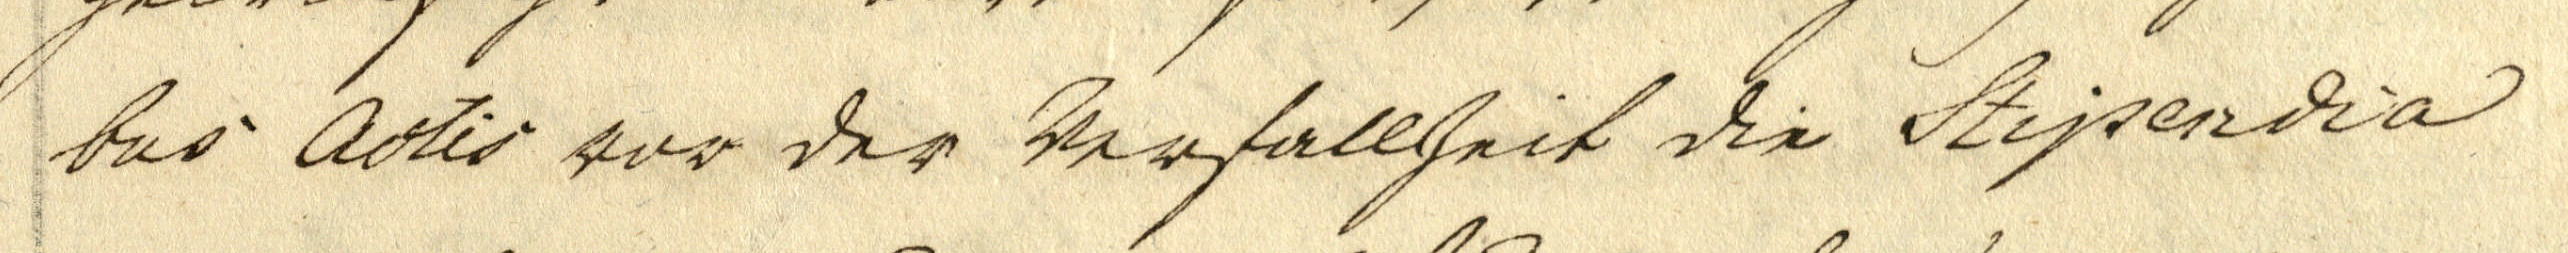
bus Actis vor der Verfallzeit die Stipendia
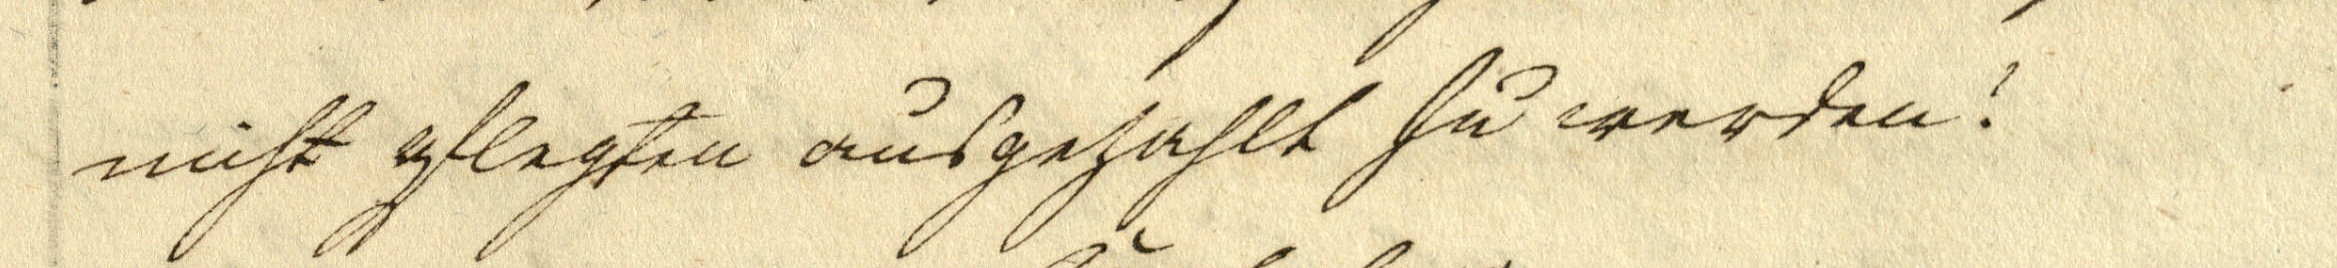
nicht pflegten ausgezahlt zu werden?
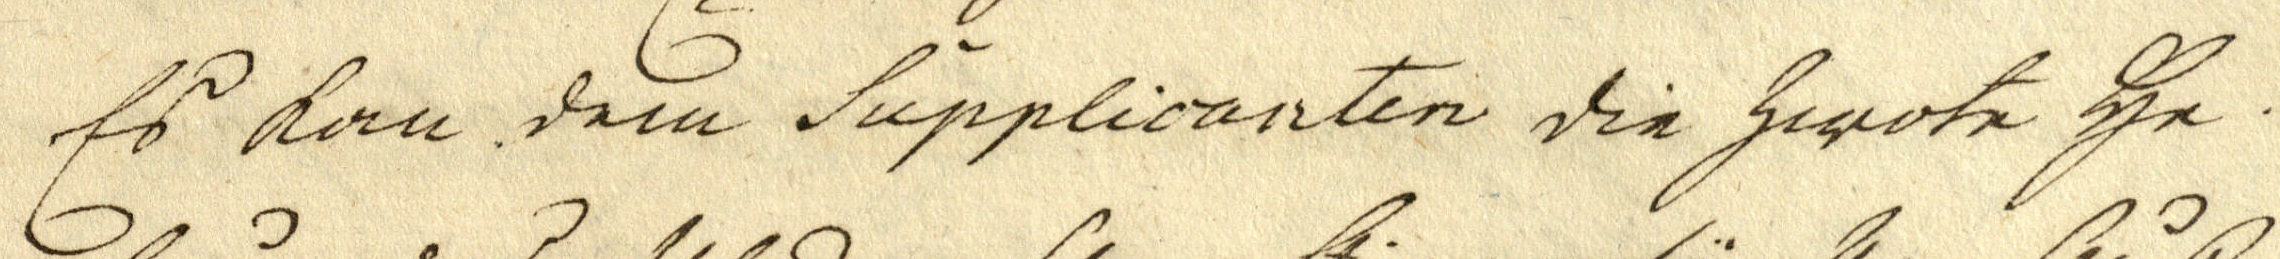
Es kan dem Supplicanten die zwote He-
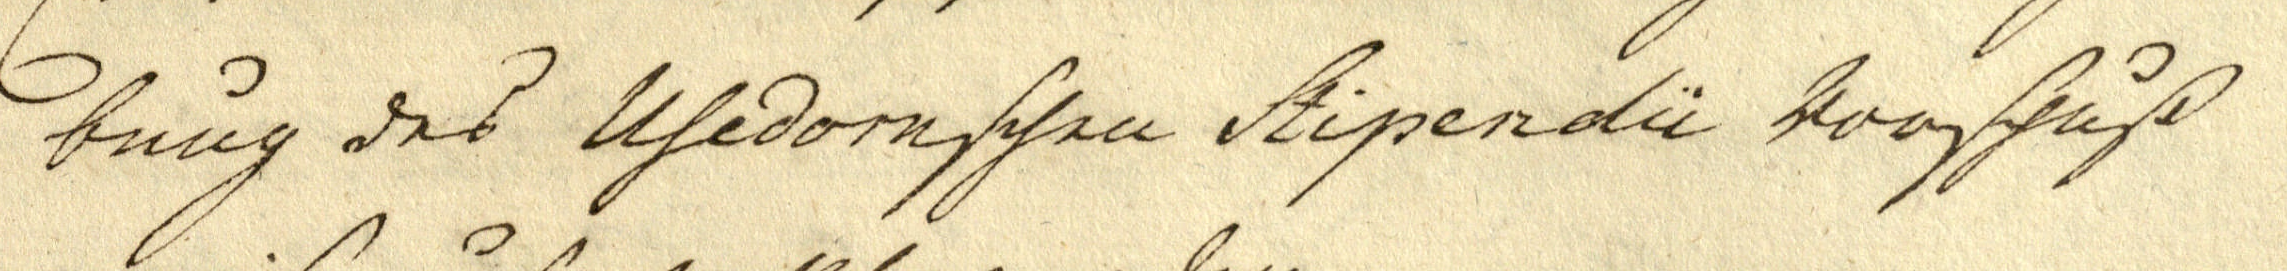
bung des Usedomschen Stipendii vorschuß-
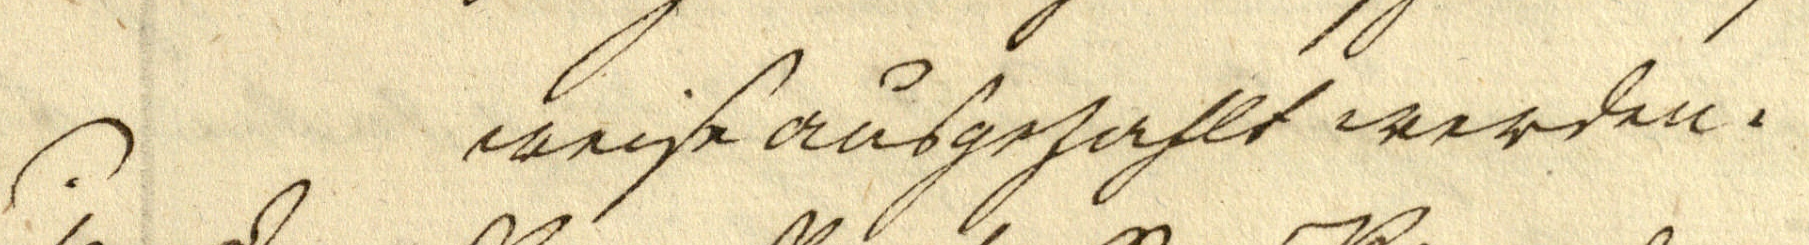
weise ausgezahlt werden.
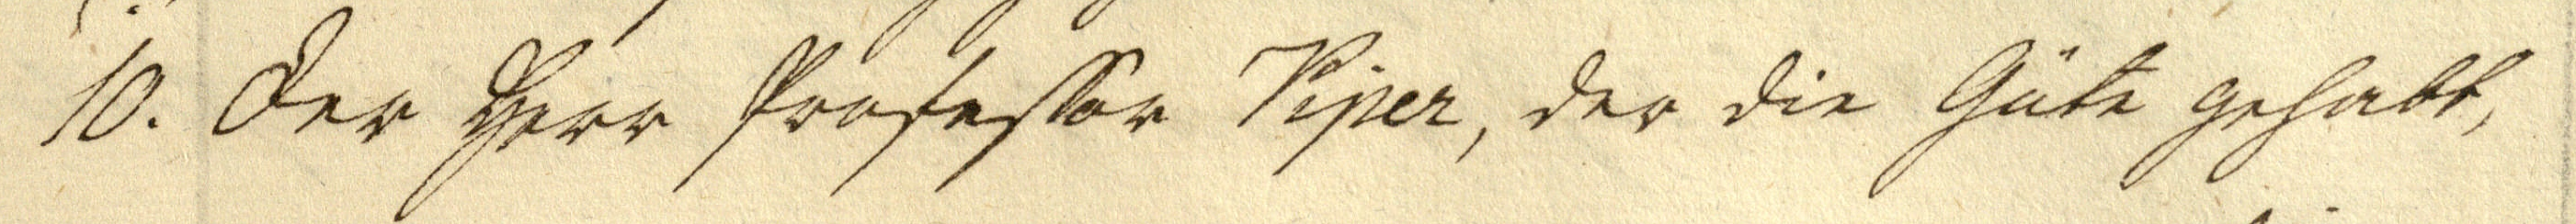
10. Der Herr Professor Piper, der die Güte gehabt,
